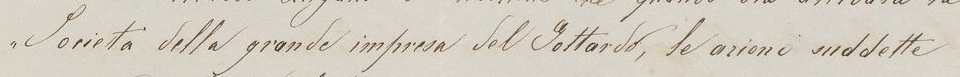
Società della grande impresa del Gottardo, le azioni suddette
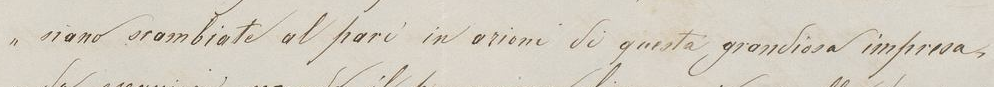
siano scambiate al pari in azioni di questa grandiosa impresa
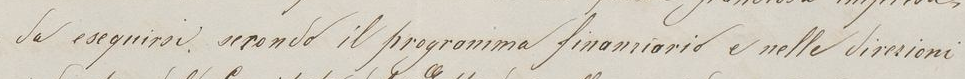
da eseguirsi, secondo il programma finanziario e nelle direzioni
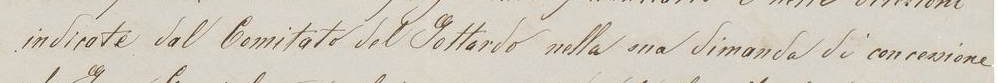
indicate dal Comitato del Gottardo nella sua dimanda di concessione
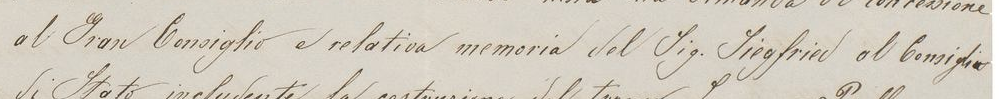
al Gran Consiglio e relativa memoria del Sig. Siegfried al Consiglio
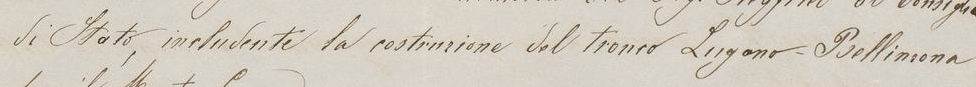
di Stato, includente la costruzione del tronco Lugano–Bellinzona
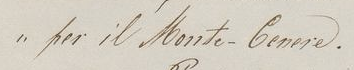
per il Monte-Cenere.»
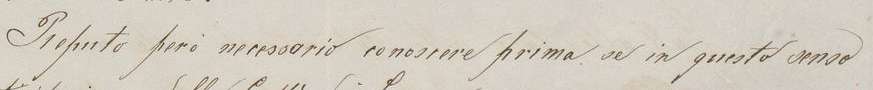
Preputo però necessario conoscere prima se in questo senso
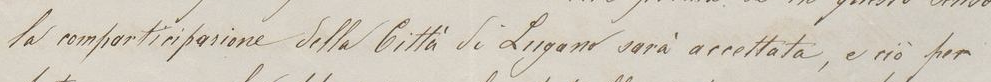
la comparticipazione della Città di Lugano sarà accettata, e ciò per
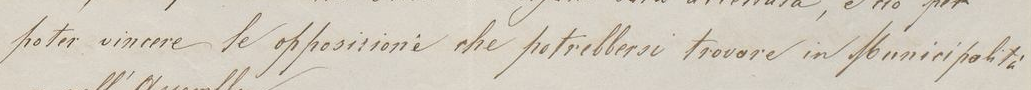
poter vincere le opposizione che potrebbersi trovare in Municipalità
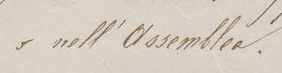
& nell'assemblea.
